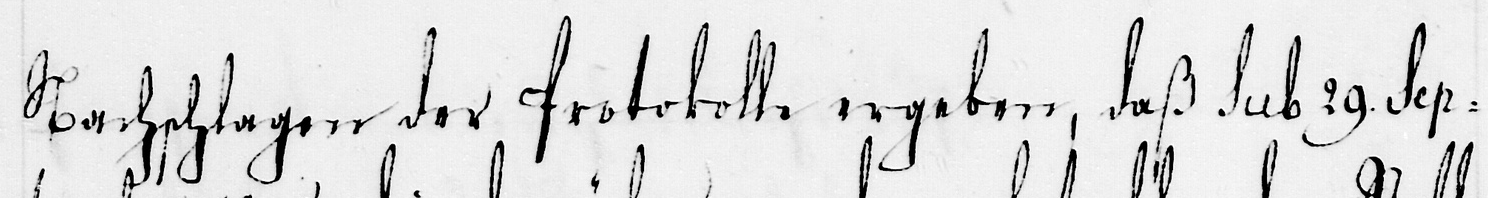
Nachschlagen der Protokolle ergeben, daß sub 29. Sep¬
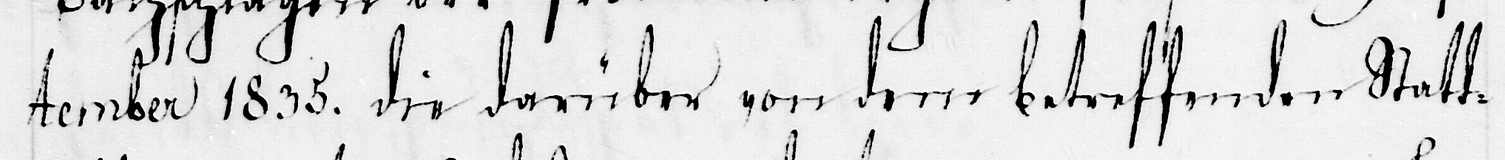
tember 1835. die darüber von dem betreffenden Statt¬
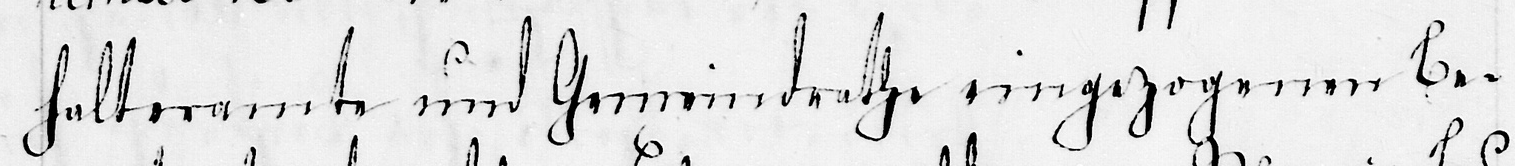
halteramte und Gemeindrathe eingezogenen Be¬
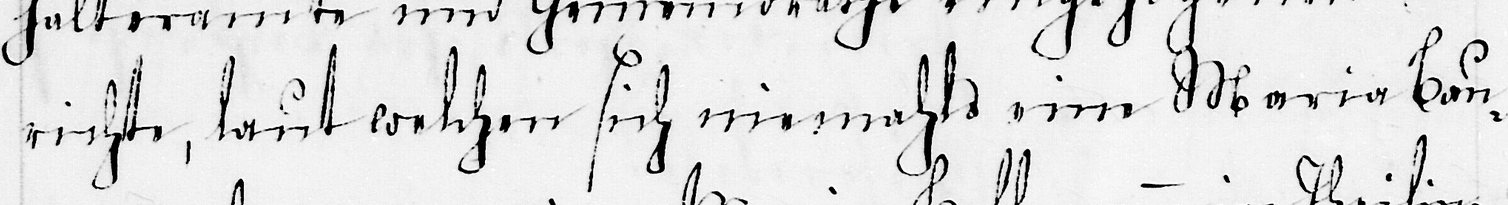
richte, laut welchen sich niemahls eine Maria Bau¬
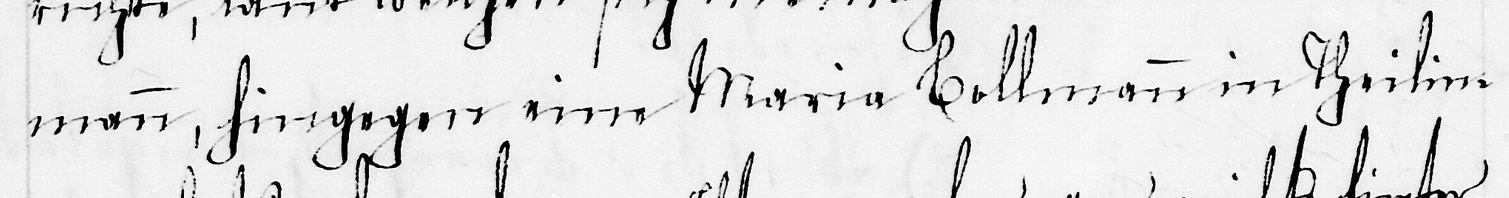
mann, hingegen eine Maria Bollmann in Theilin¬
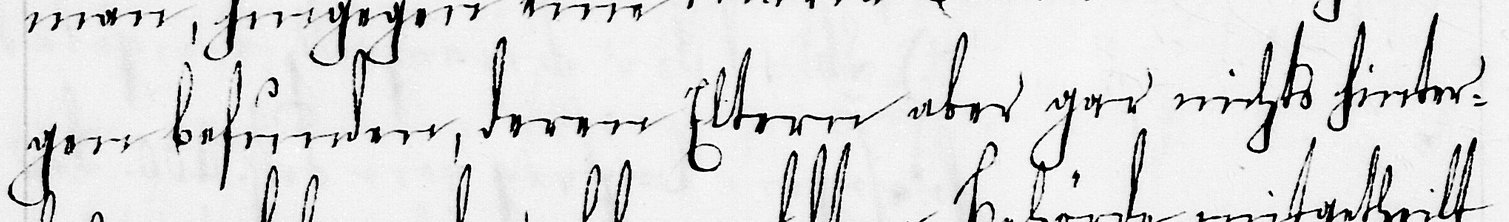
gen befunden, deren Eltern aber gar nichts hinter¬
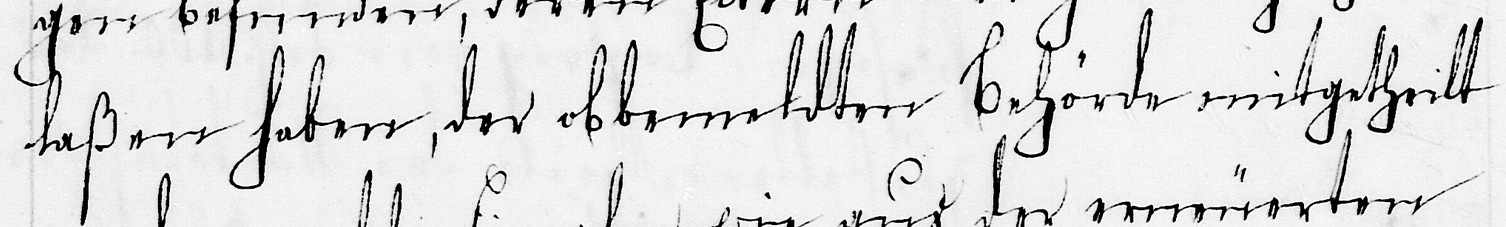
laßen haben, der obbemeldten Behörde mitgetheilt
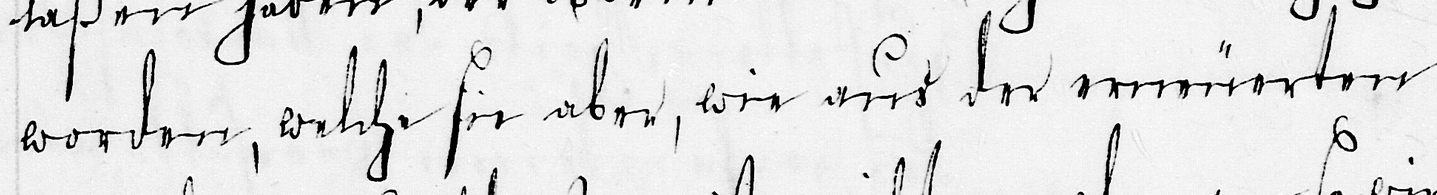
worden, welche sie aber, wie aus der erneuerten
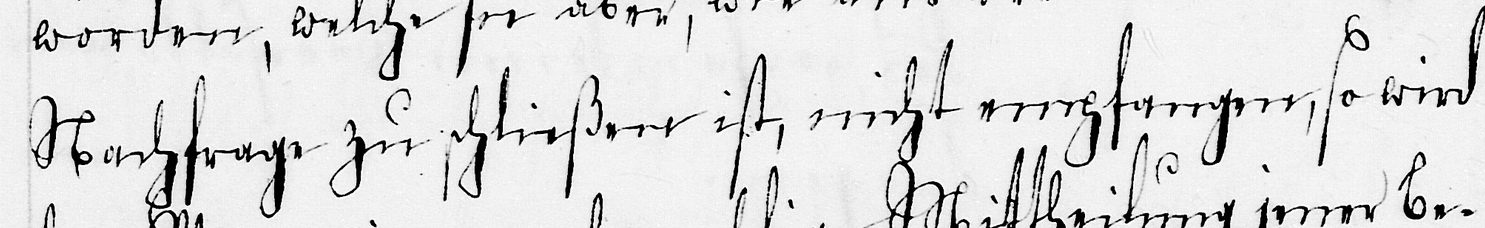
Nachfrage zu schließen ist, nicht empfangen, so wird
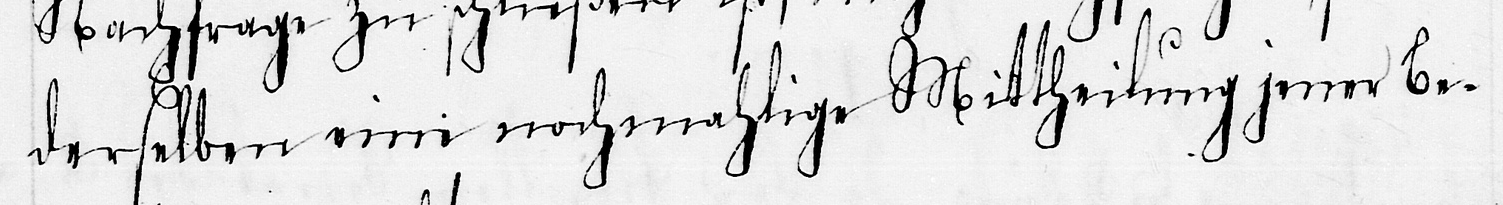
derselben eine nochmahlige Mittheilung jener Be¬
